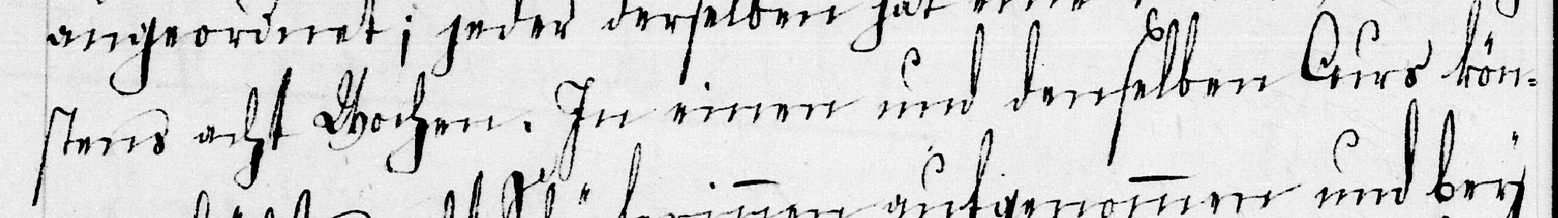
stens acht Wochen. In einen und denselben Curs kön¬
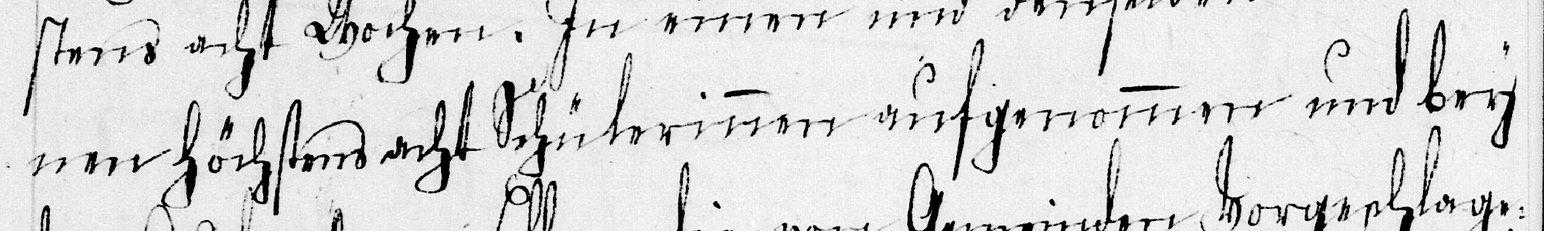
nen höchstens acht Schülerinnen aufgenommen und bey
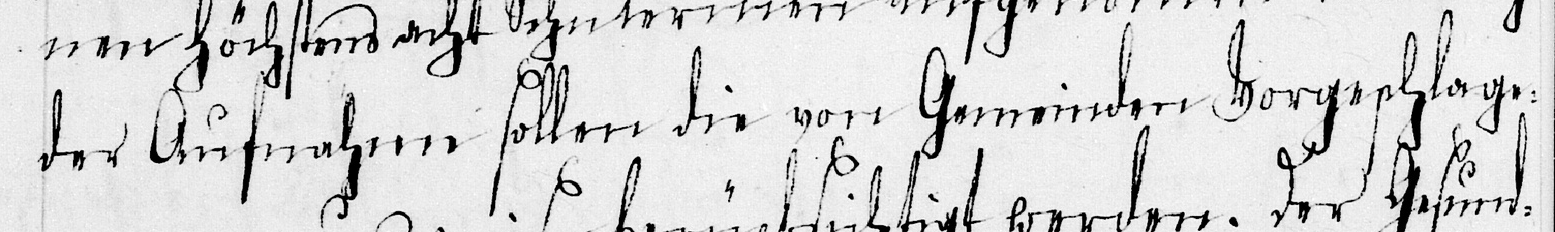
der Aufnahme sollen die von Gemeinden Vorgeschlage¬
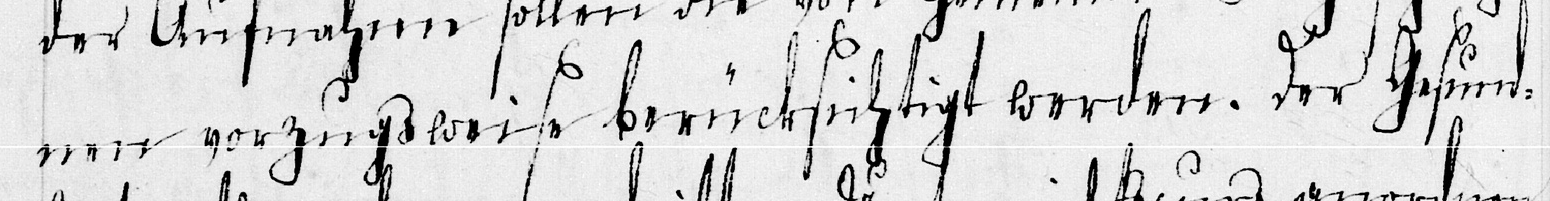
nen vorzugsweise berücksichtigt werden. Der Gesund¬
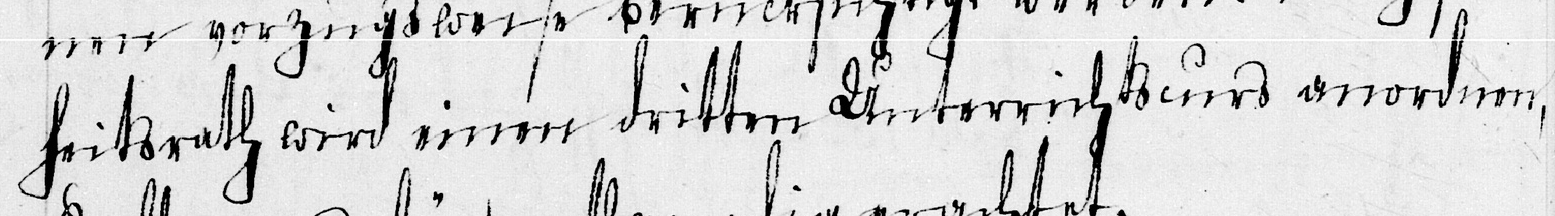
heitsrath wird einen dritten Unterrichtscurs anordnen,
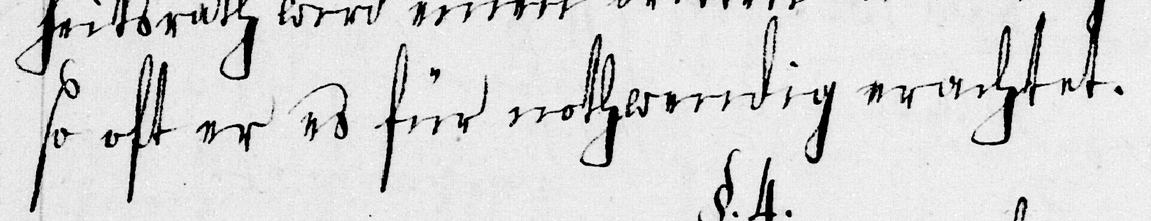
so oft er es für nothwendig erachtet.
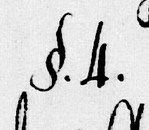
§. 4.
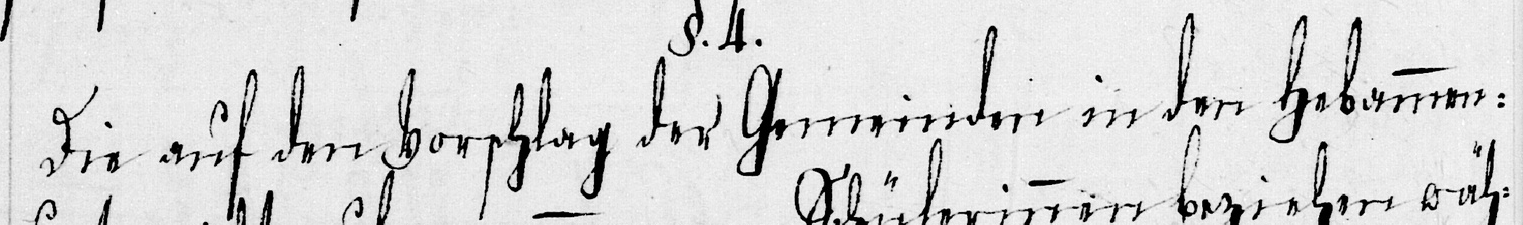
Die auf den Vorschlag der Gemeinden in den Hebammen¬
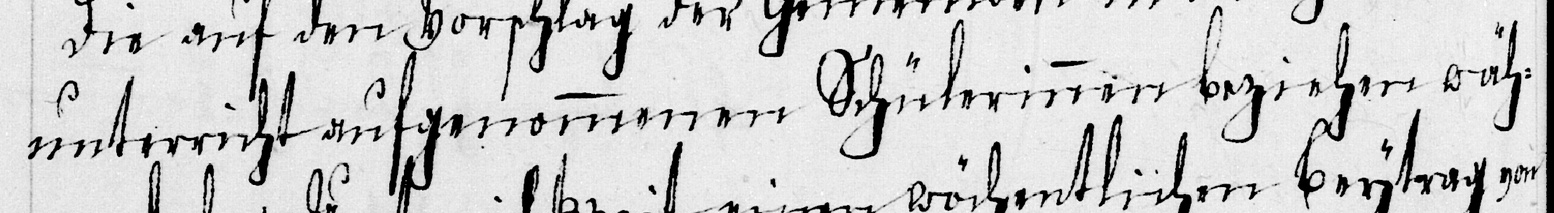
unterricht aufgenommenen Schülerinnen beziehen wäh¬
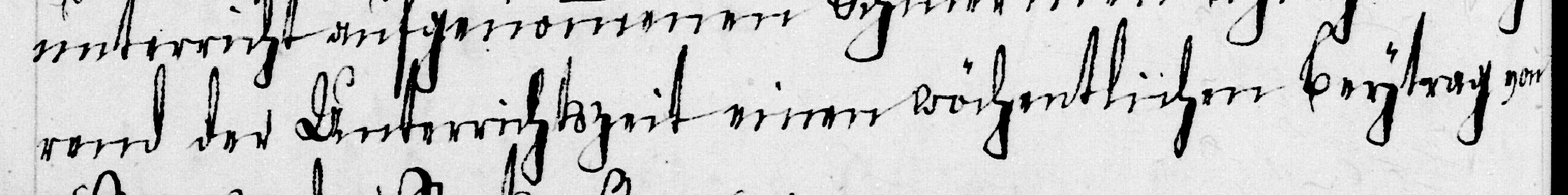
rend der Unterrichtszeit einen wöchentlichen Beytrag von
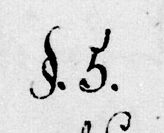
§. 5.
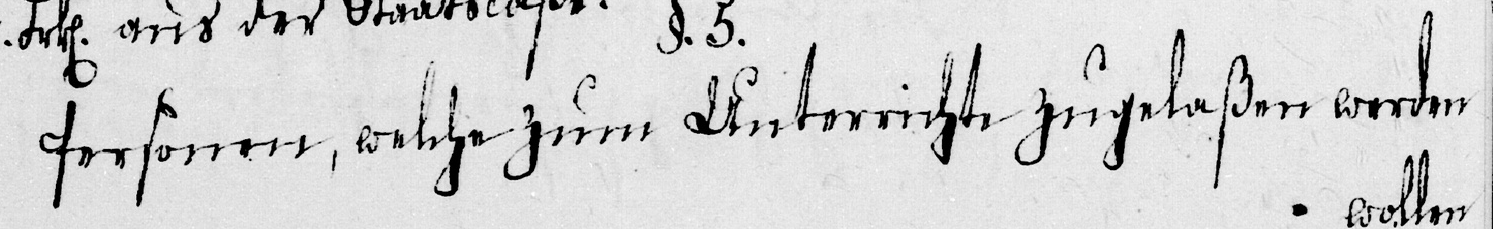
Personen, welche zum Unterrichte zugelaßen werden
